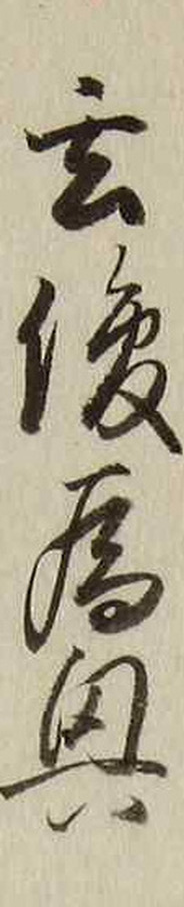玄俊為興
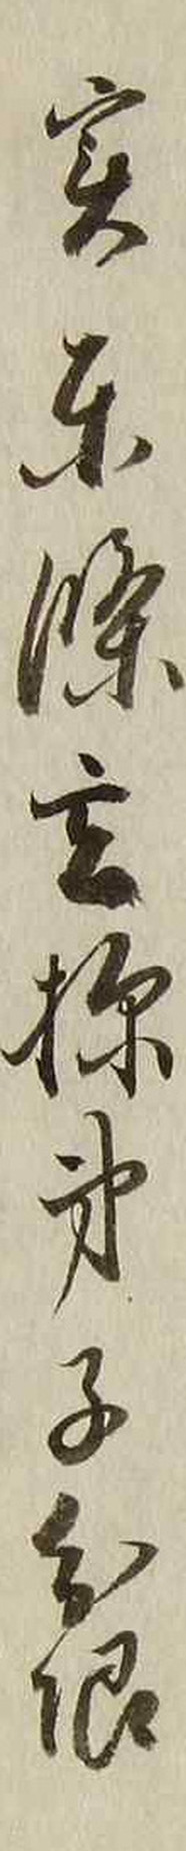実東条玄探弟子分限
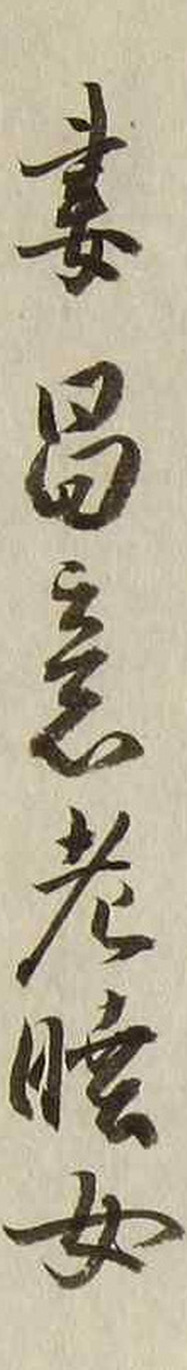妻昌意老睦女
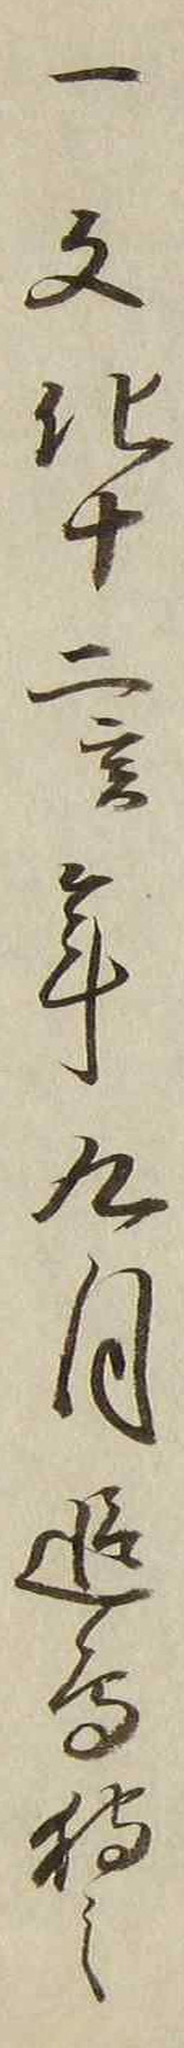一文化十二亥年九月追鳥狩之

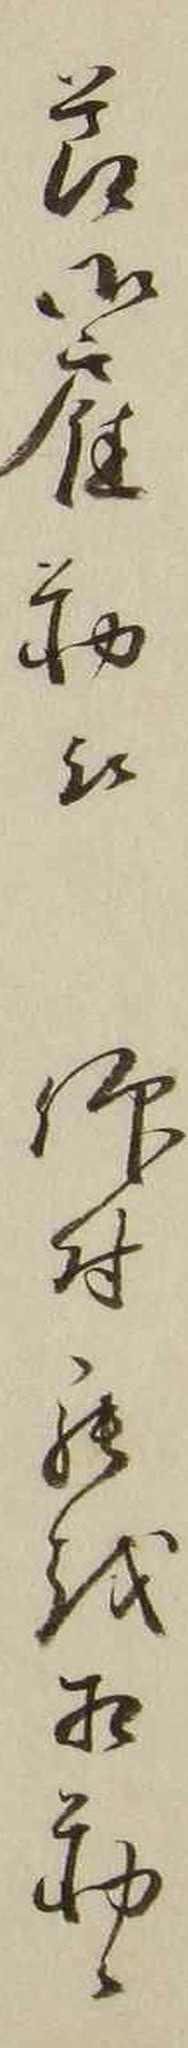節御雇勤被仰付罷越相勤候
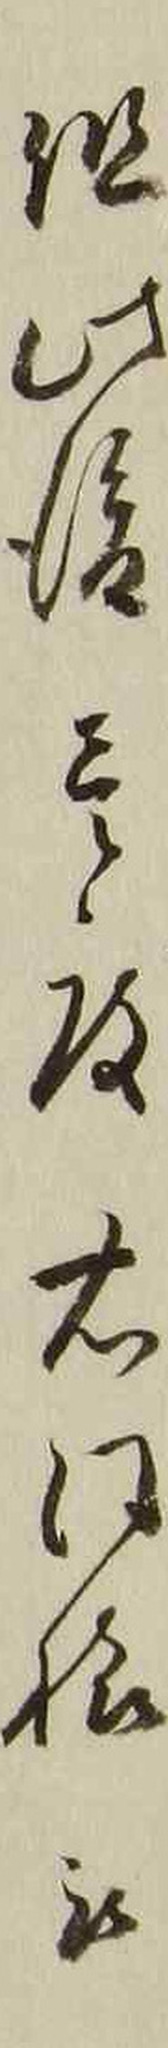但此後壱度右同様被
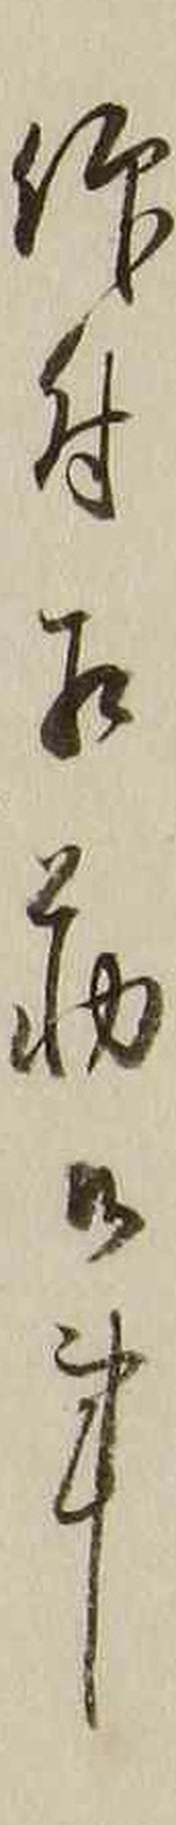仰付相勤候事
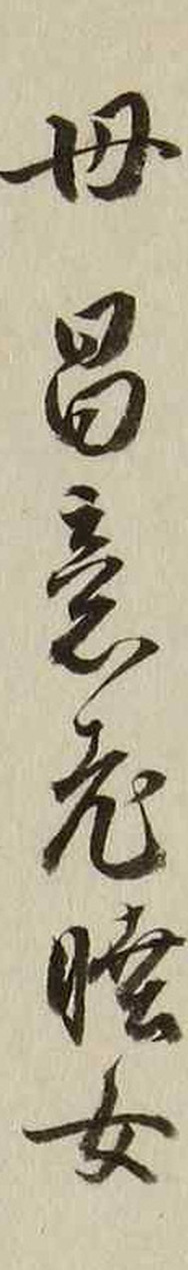母昌意老睦女
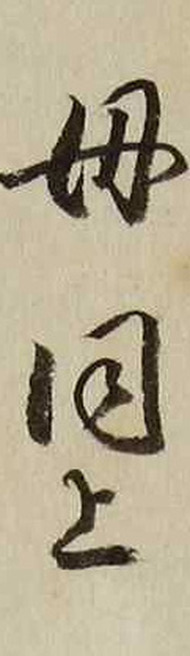母同上

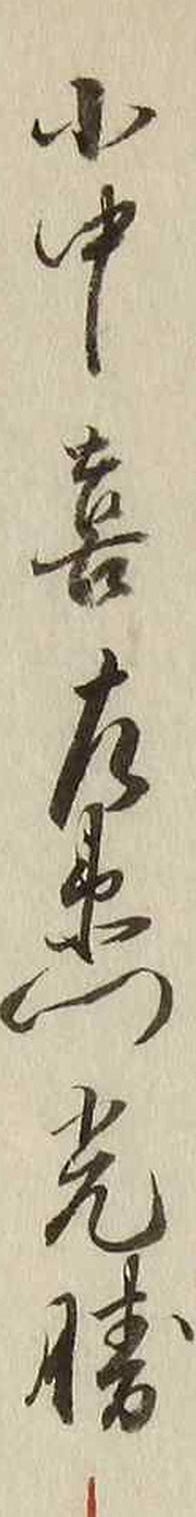小中喜左衛門光勝
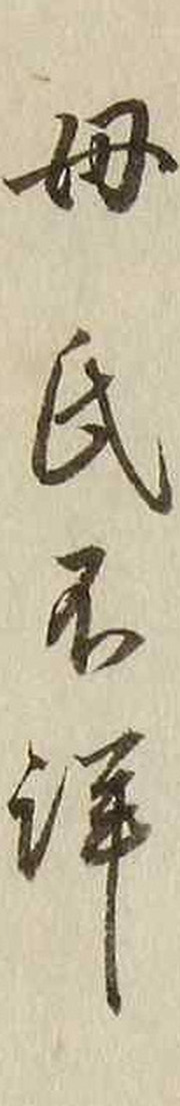母氏不詳
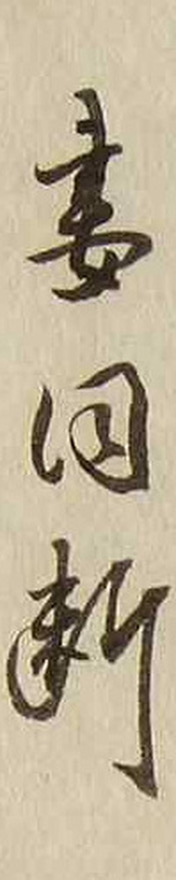妻同断
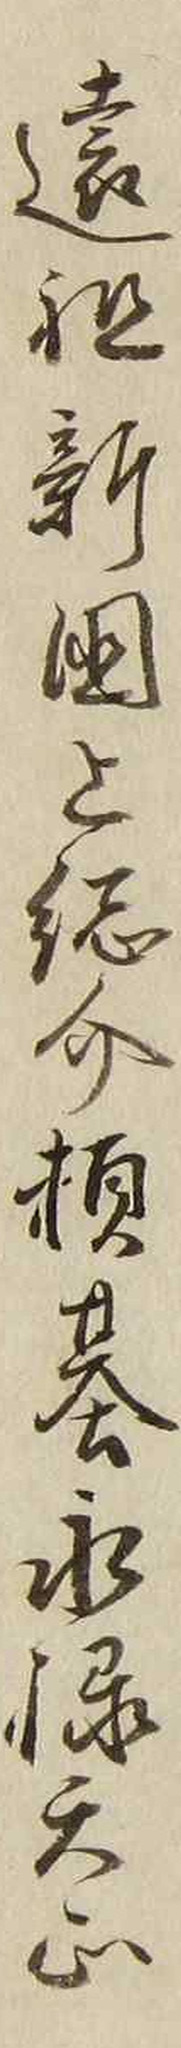遠祖新国上総介頼基永禄天正

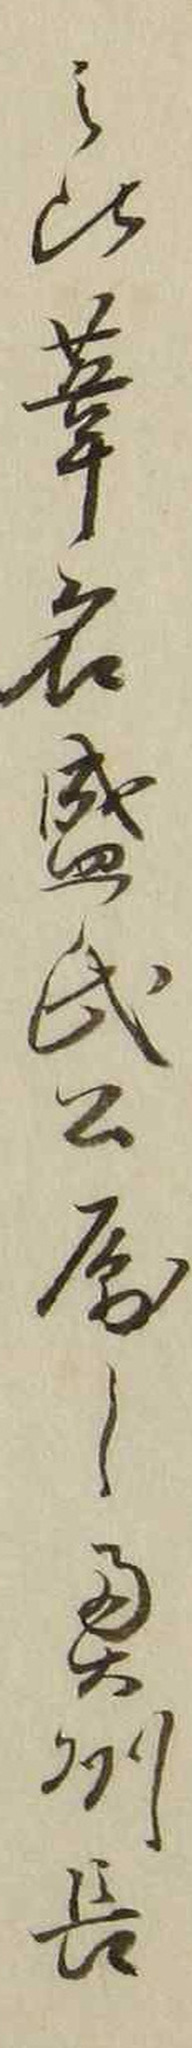之比葦名盛氏公属之奥州長
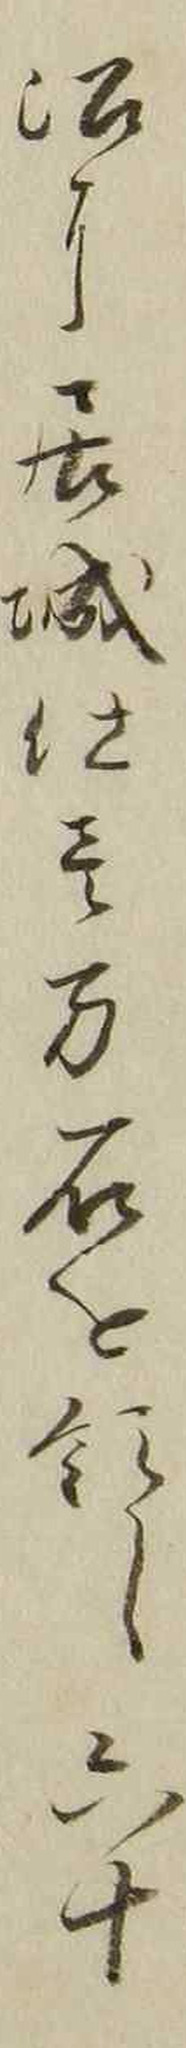沼に居城仕壱万石を領し六十
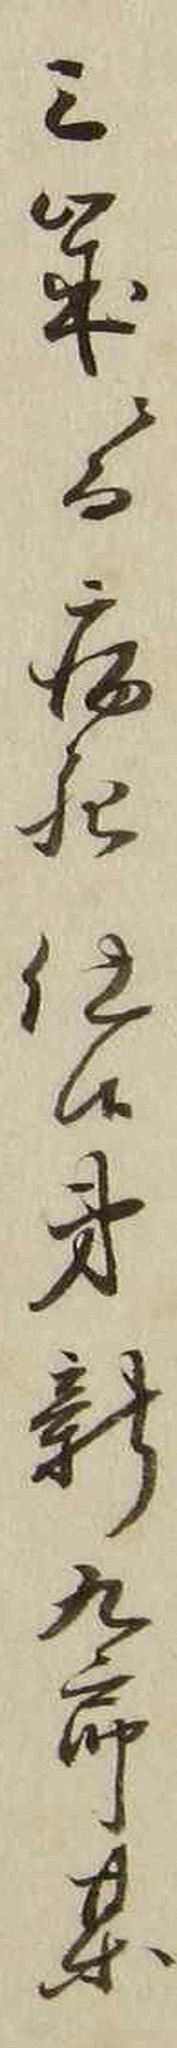三歳ニ而病死仕候弟新九郎某
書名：諸士系譜　巻之52　に之部3
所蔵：会津若松市立会津図書館
